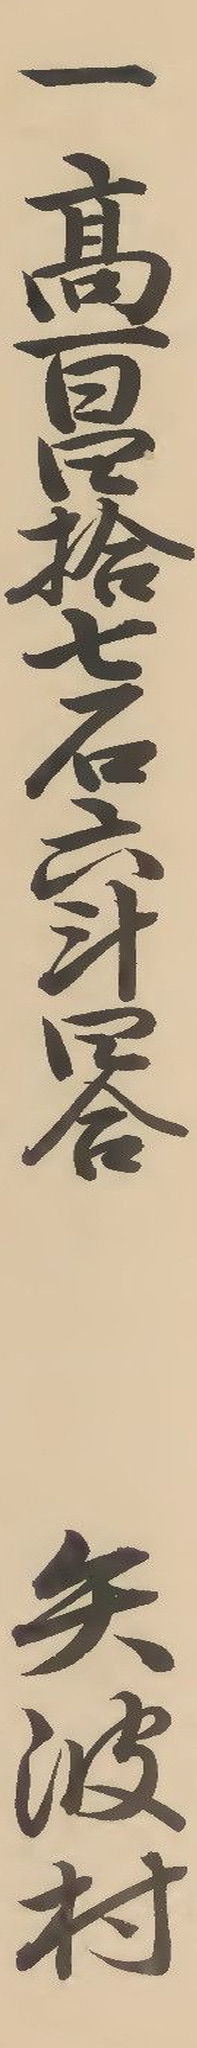一高百四拾七石六斗四合矢波村
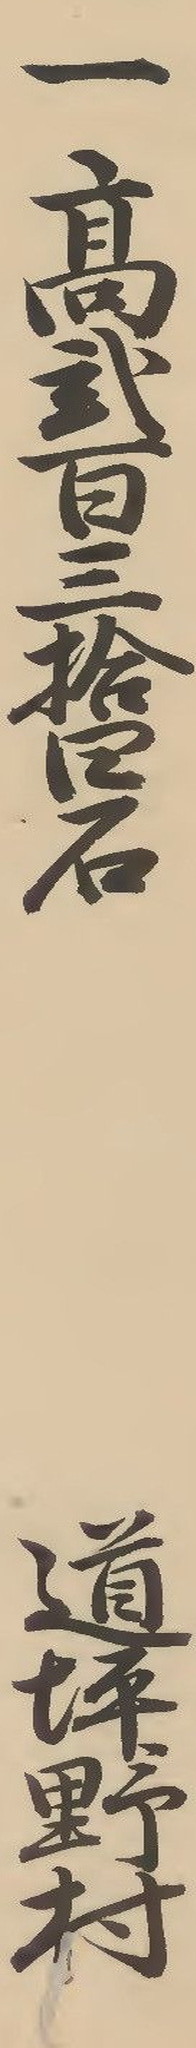一高弐百三拾四石道坪野村
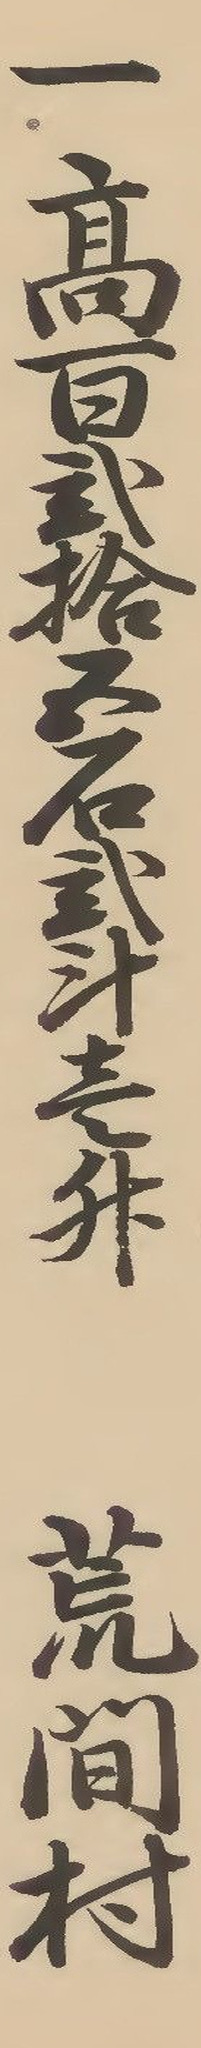一高百弐拾五石弐斗壱升荒間村
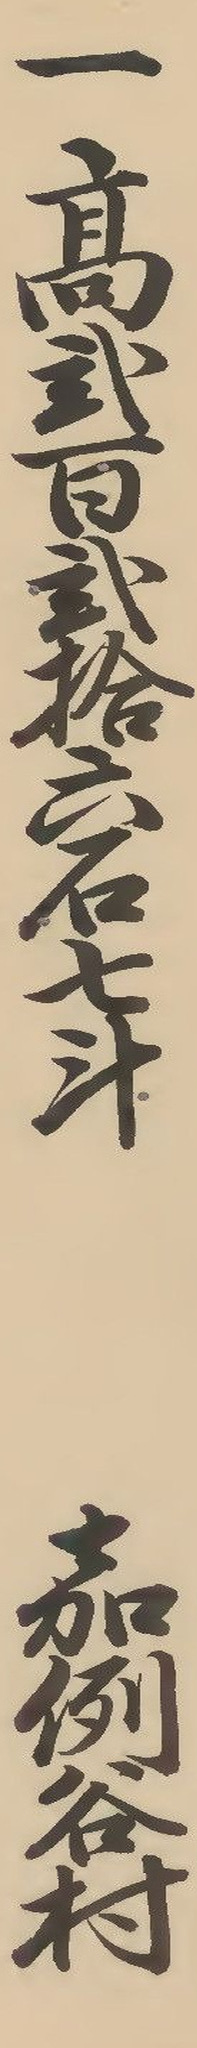一高弐百弐拾六石七斗嘉例谷村

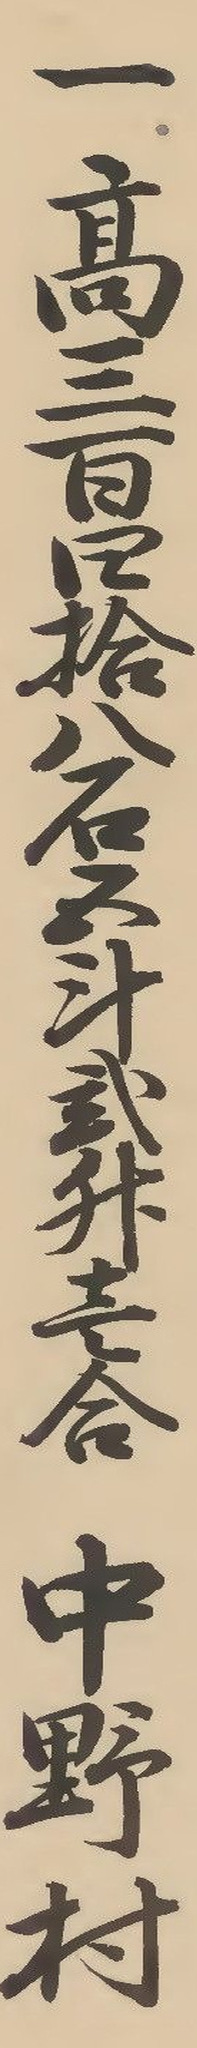一高三百四拾八石五斗弐升壱合中野村
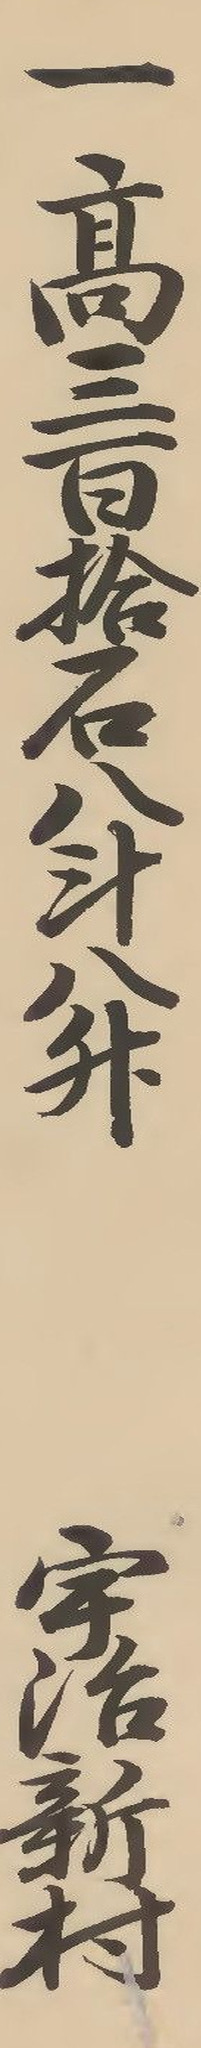一高三百拾石八斗八升宇治新村
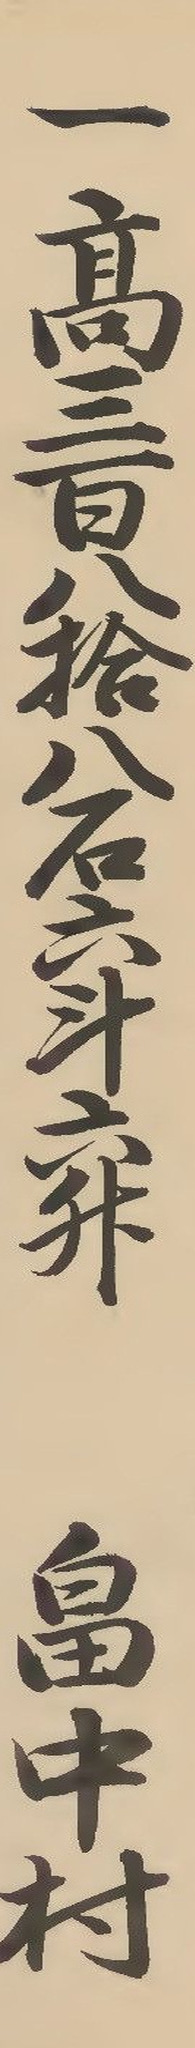一高三百八拾八石六斗六升畠中村
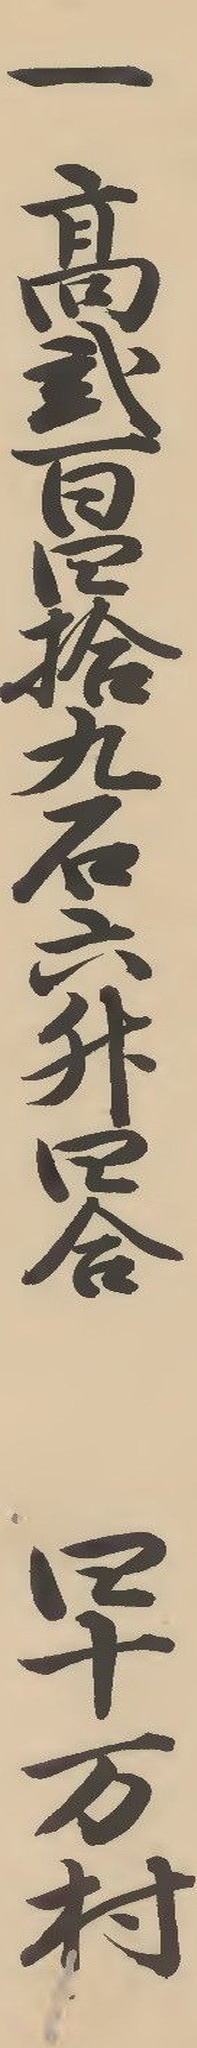一高弐百四拾九石六升四合四十万村
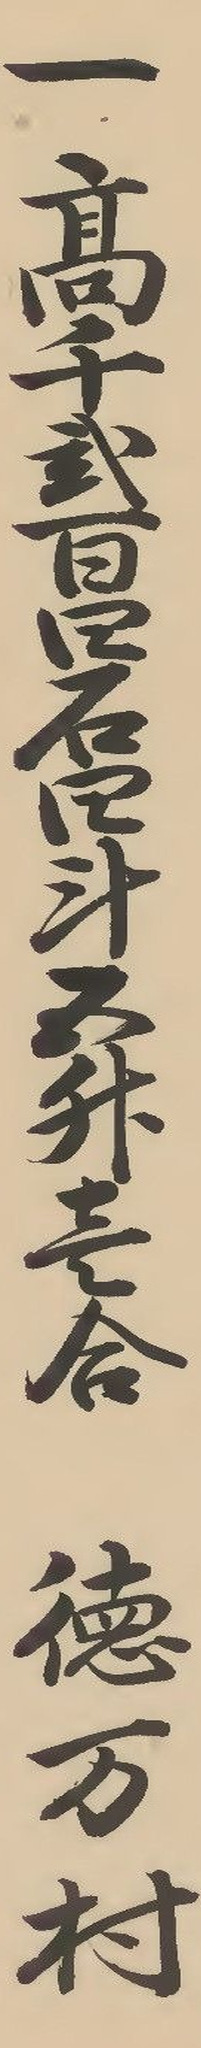一高千弐百四石四斗五升壱合徳万村
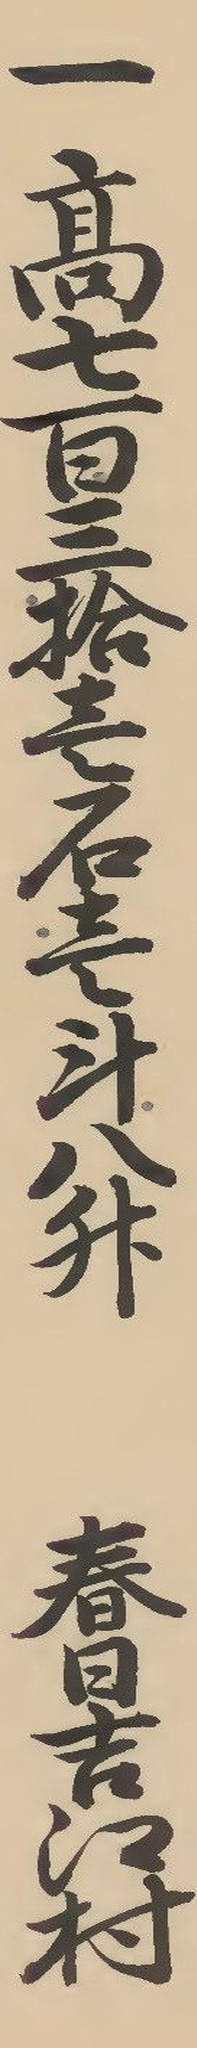一高七百三拾壱石壱斗八升春日吉江村

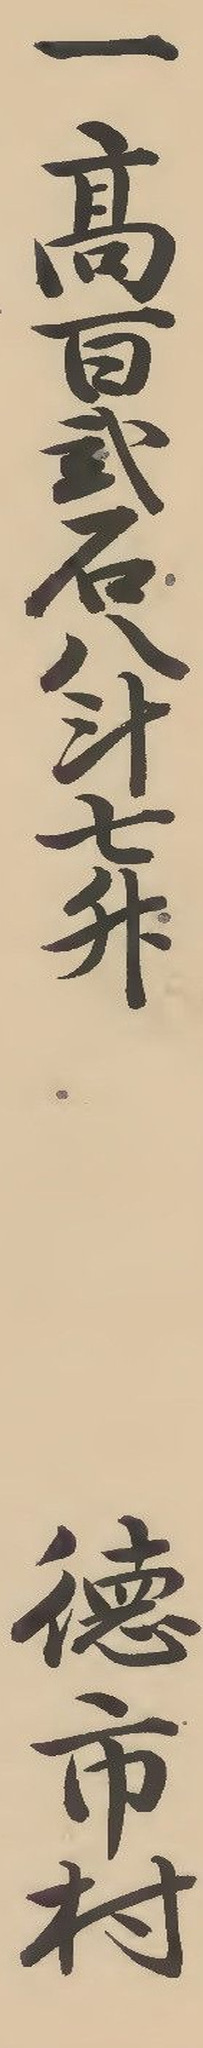一高百弐石八斗七升徳市村
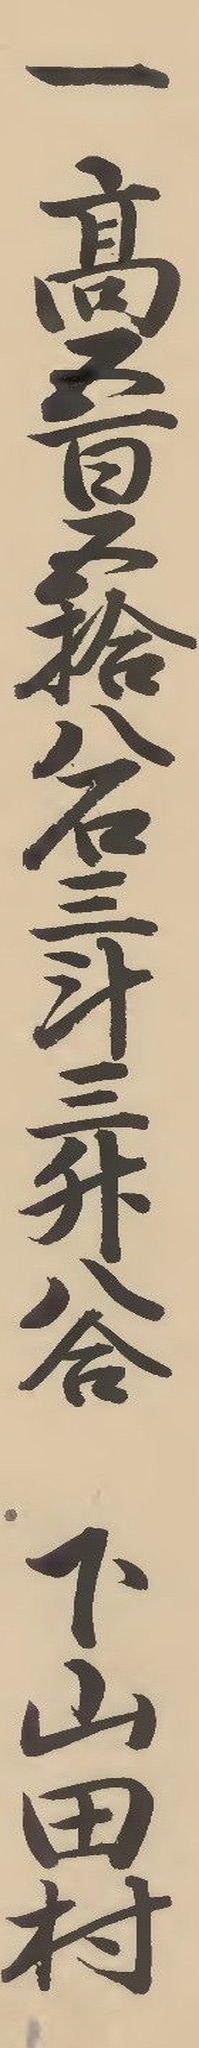一高五百五拾八石三斗三升八合下山田村
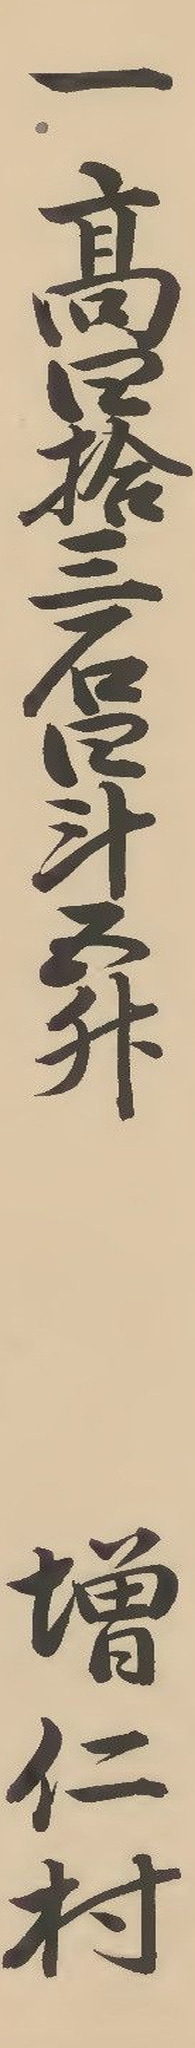一高四拾三石四斗五升増仁村
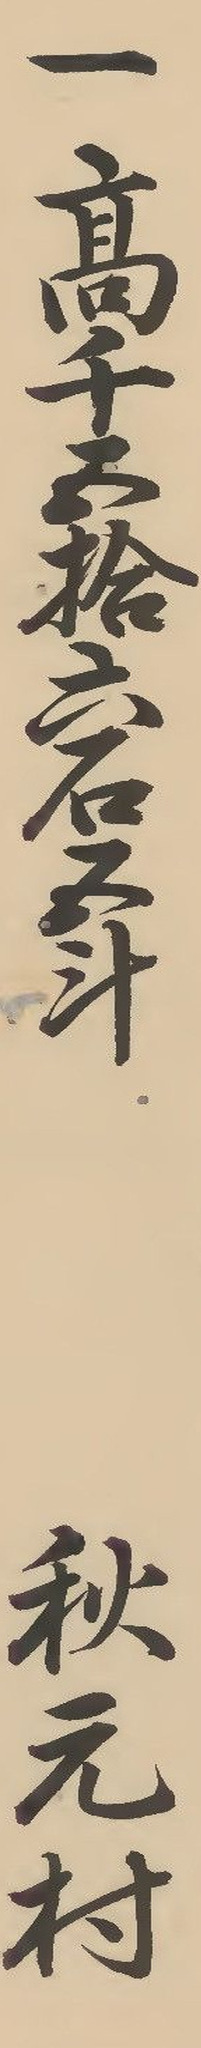一高千五拾六石五斗秋元村

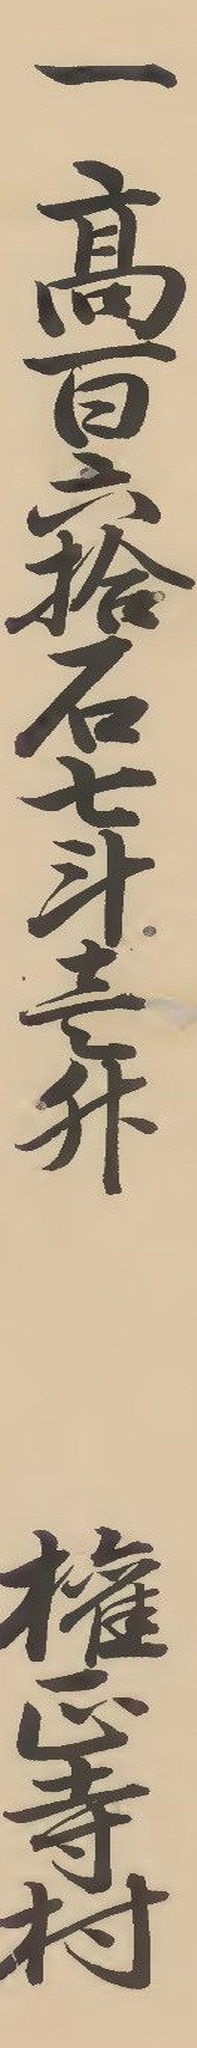一高百六拾石七斗壱升権正寺村
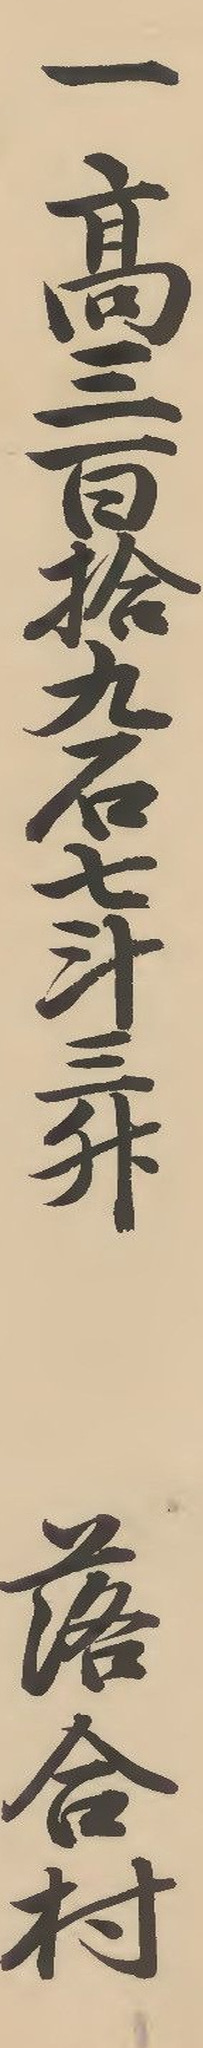一高三百拾九石七斗三升落合村
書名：越中国郷帳
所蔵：国立公文書館 National Archives of Japan
